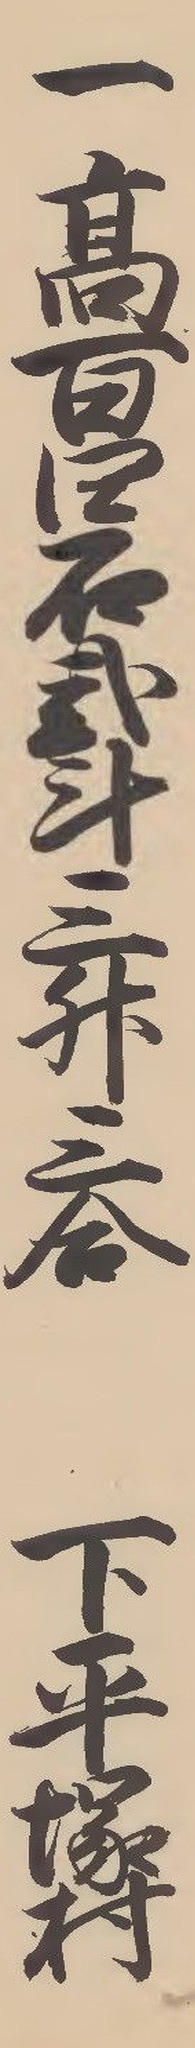一高百四石弐斗三升三合下平塚村
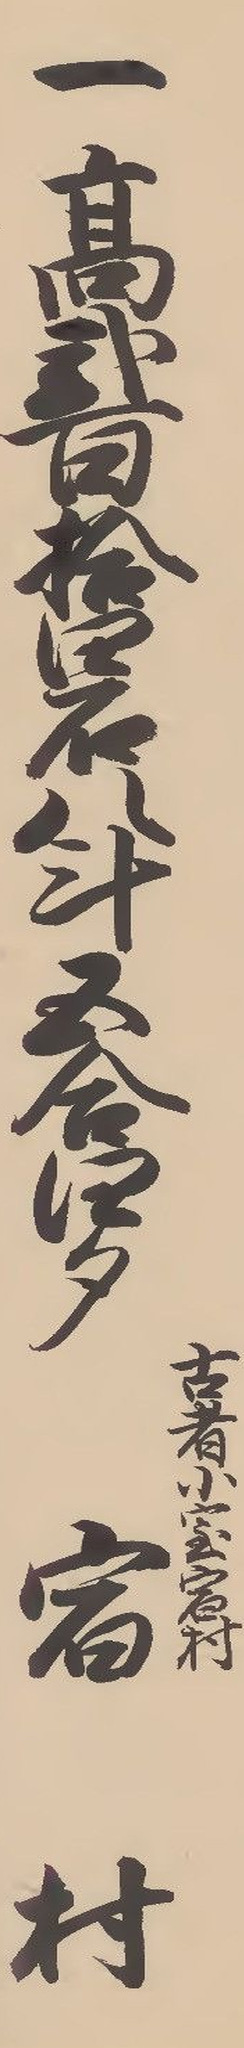一高弐百拾四石八斗五合四勺宿村
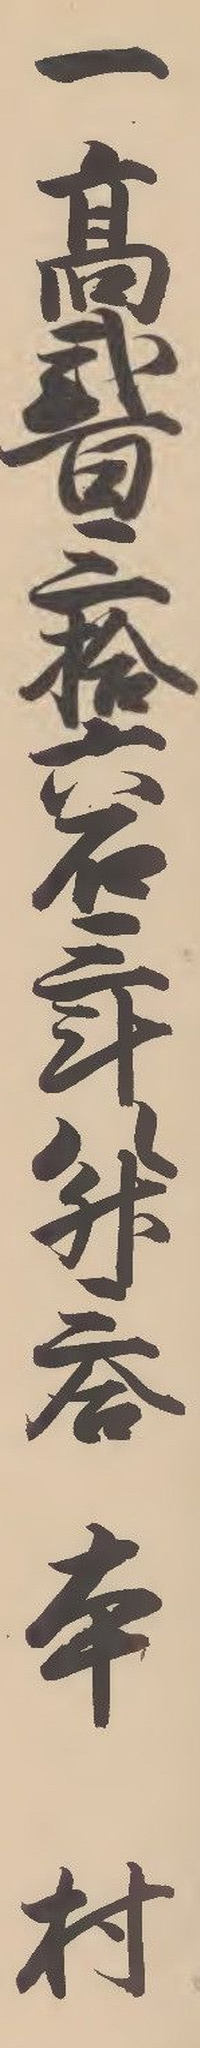一高弐百三拾六石三斗八升三合本村
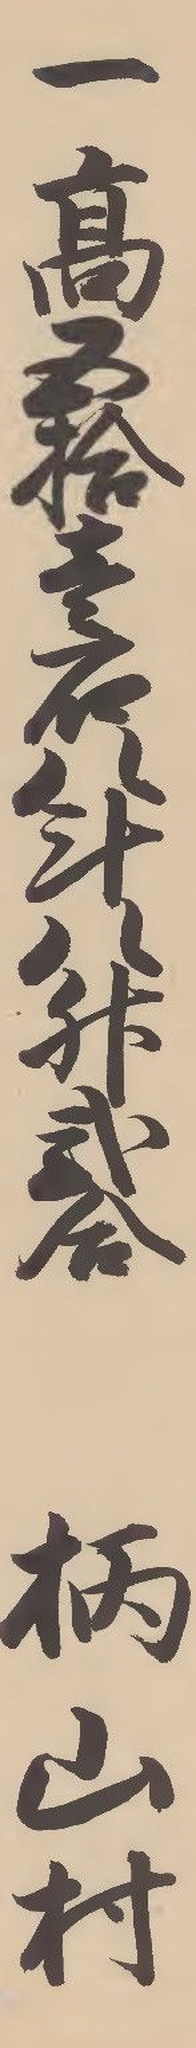一高五拾壱石八斗八升弐合柄山村
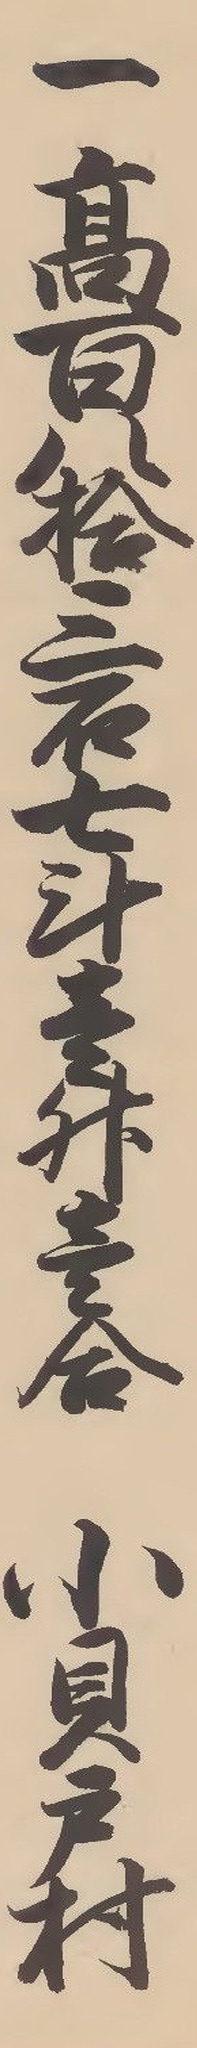一高百八拾三石七斗壱升壱合小貝戸村
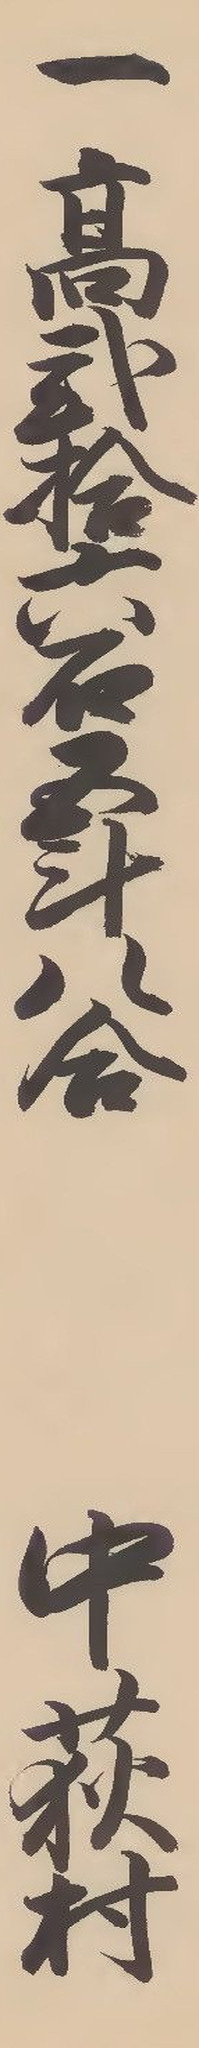一高弐拾六石五斗八合中萩村

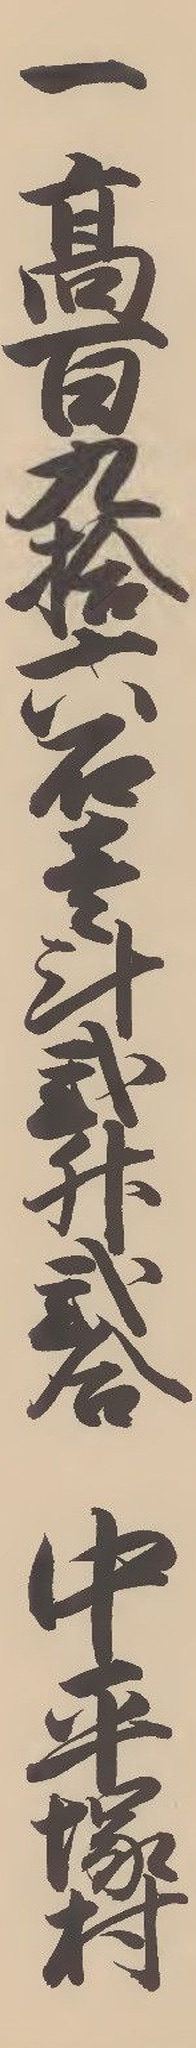一高百九拾六石壱斗弐升弐合中平塚村
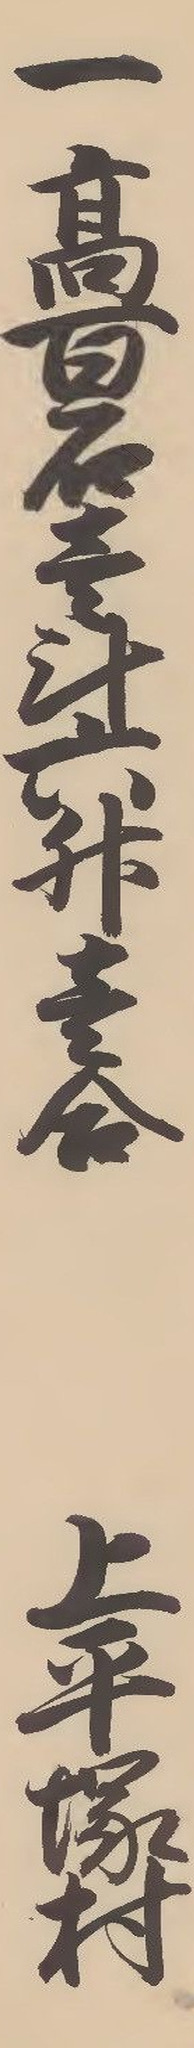一高百石壱斗六升壱合上平塚村
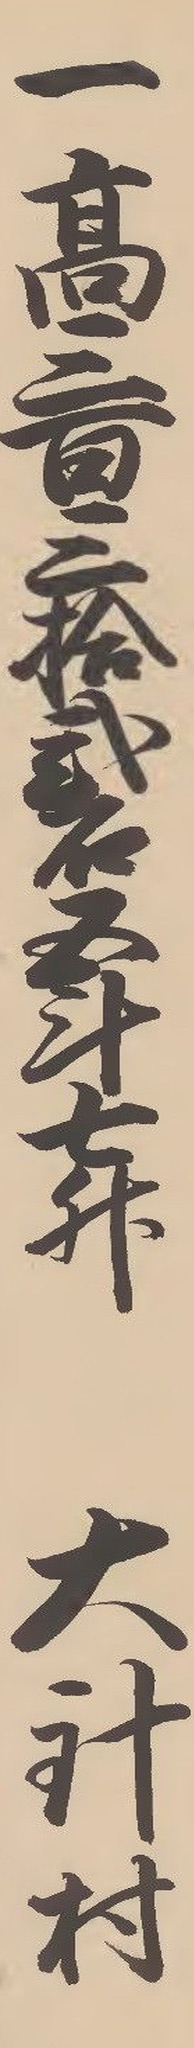一高三百三拾弐石五斗七升大針村
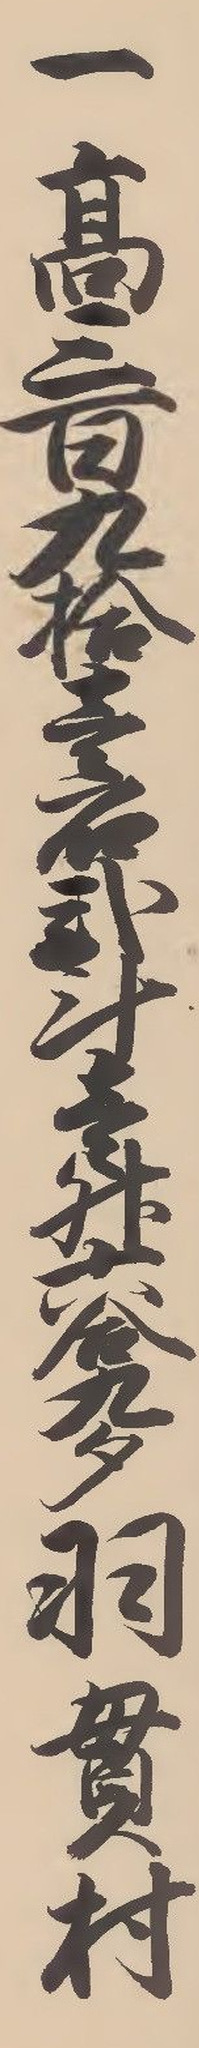一高三百九拾壱石弐斗壱升六合九勺羽貫村
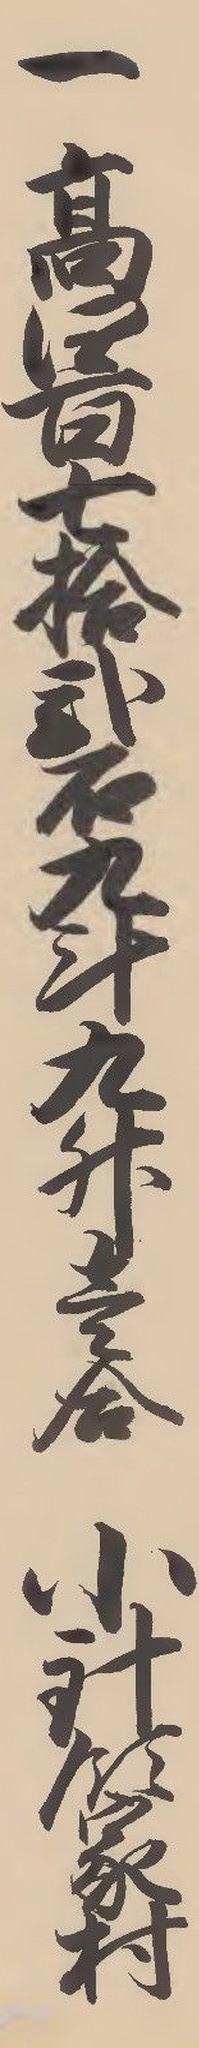一高四百七拾弐石九斗九升壱合小針領家村
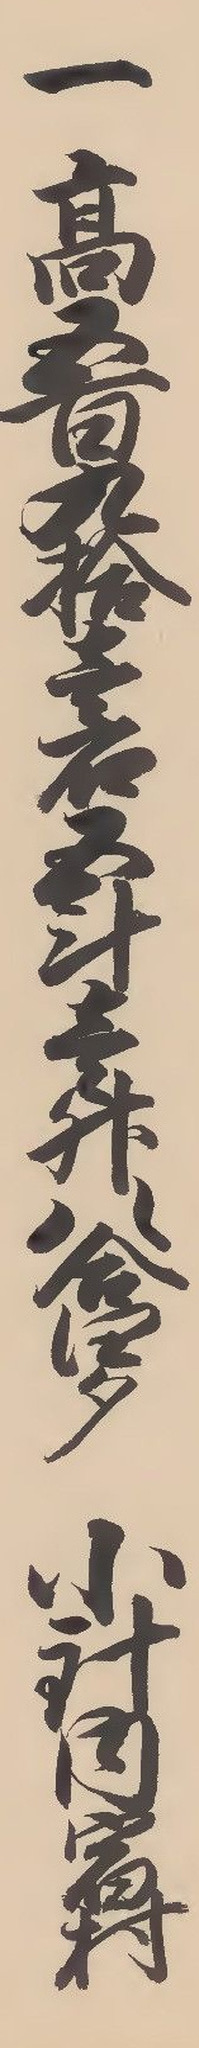一高五百九拾壱石五斗壱升八合四勺小針内宿村
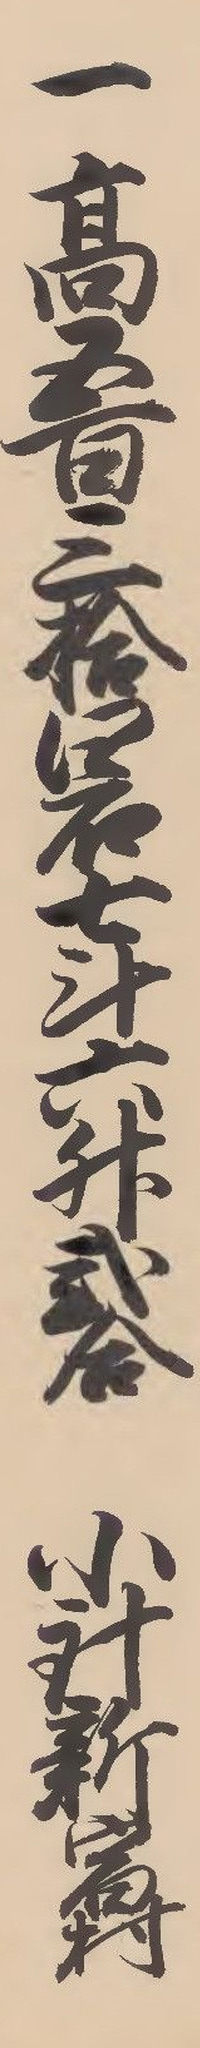一高五百三拾四石七斗六升弐合小針新宿村

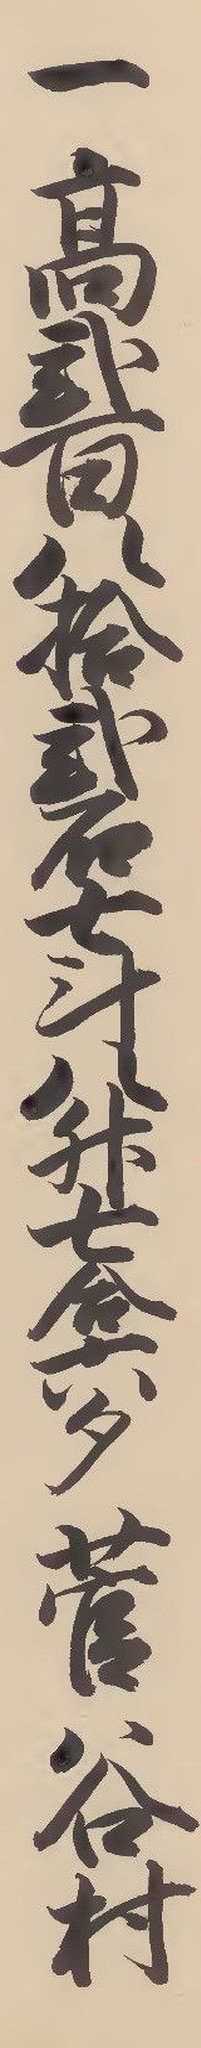一高弐百八拾弐石七斗八升七合六勺菅谷村
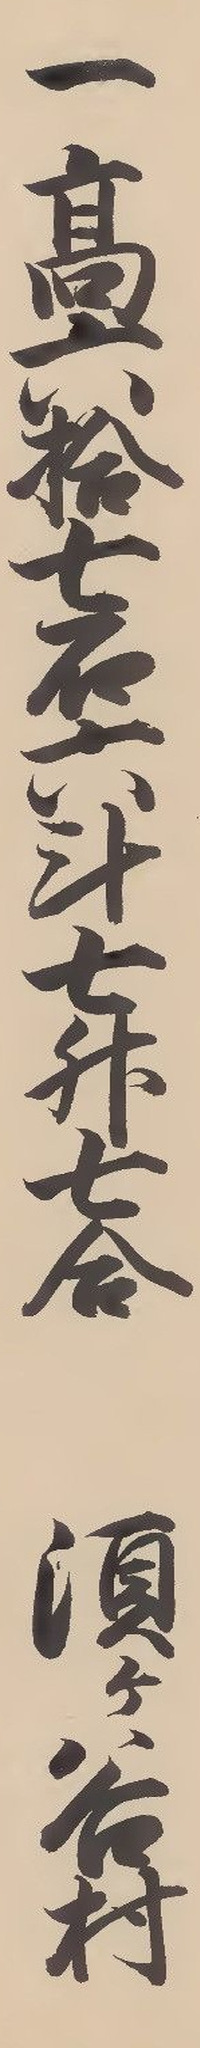一高六拾七石六斗七升七合須ヶ谷村
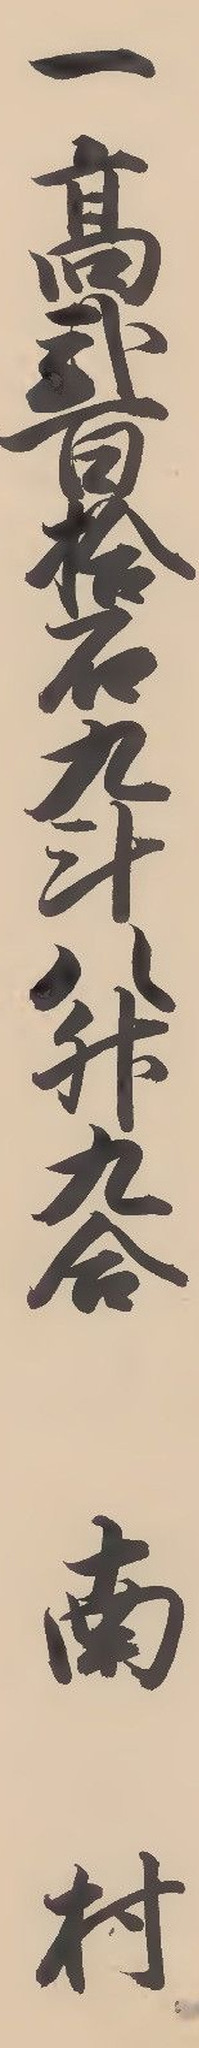一高弐百拾石九斗八升九合南村
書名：武蔵国郷帳　下
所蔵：国立公文書館 National Archives of Japan
